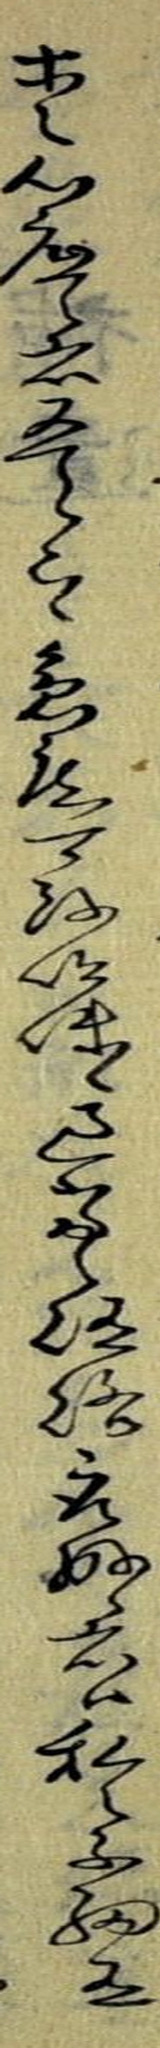等之心底之者有之候ハヽ急度可致吟味候過当之賄賂取扱候者ハ私之子細有
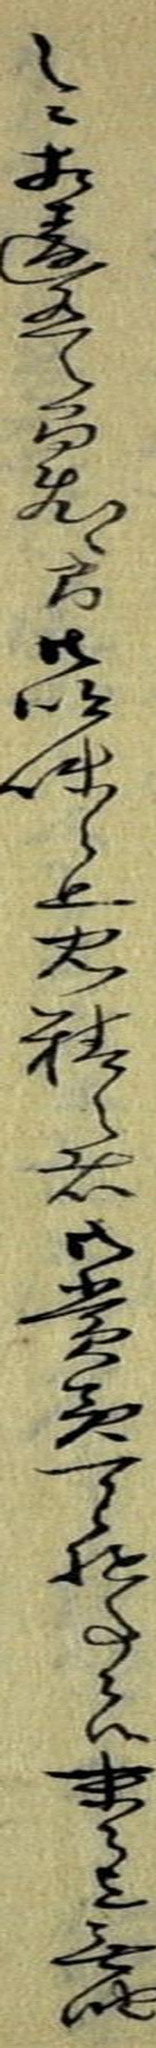之ニ相違有之間敷候間御吟味之上忠精之者御賞美可被遊事ニ候末々迄無油
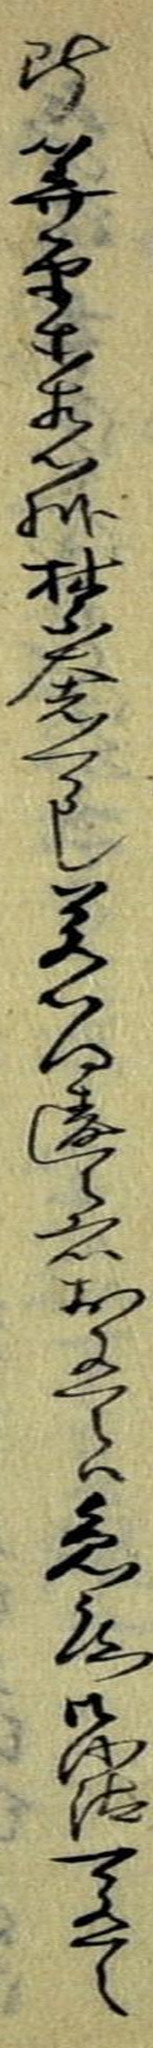断算筆等相心掛禁奢可申候若心得違候者於有之ハ急度御沙汰可有之
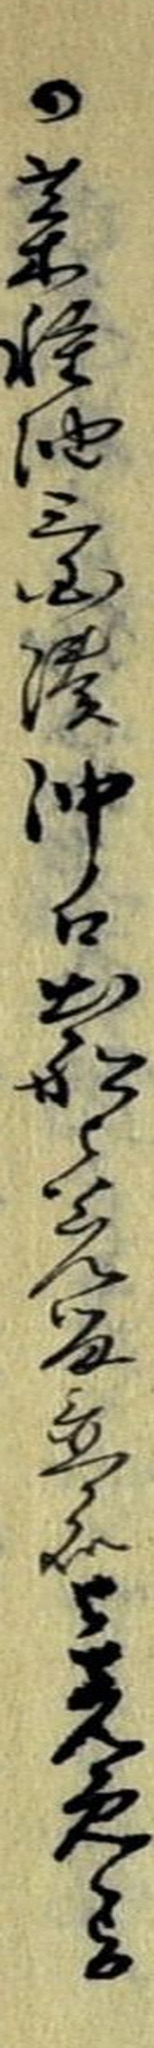○菜種油三国湊沖ノ口出船被差留置候処被差免旨
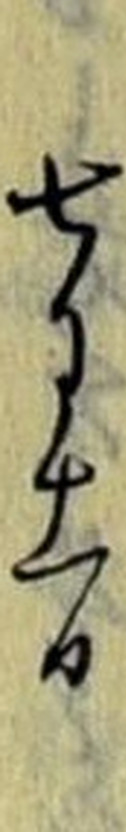七月十一日
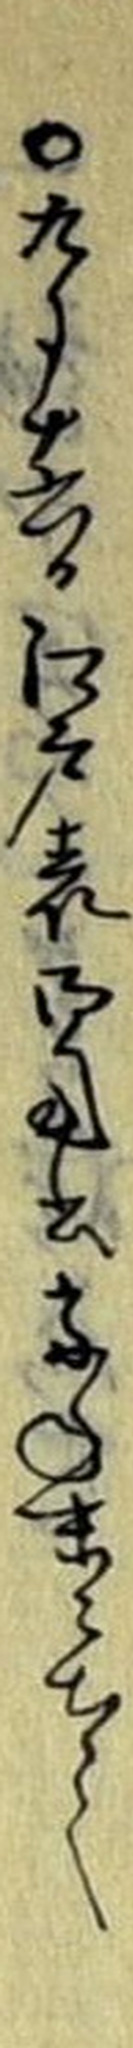○九月十六日江戸表御用書当年末々出之
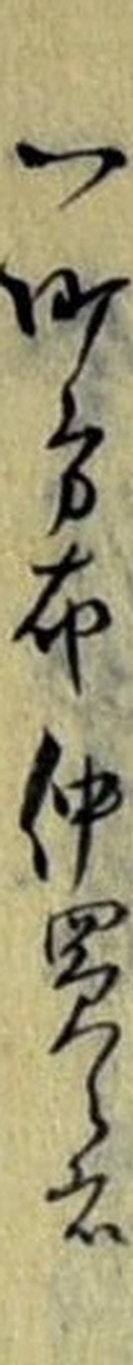一町方布仲買之者
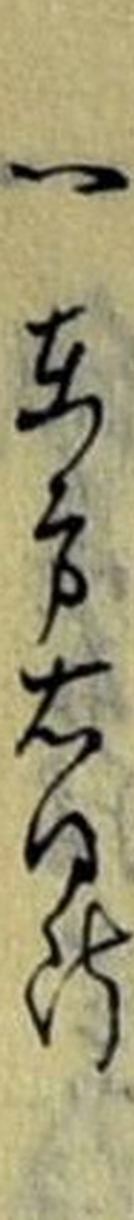一在方右同断
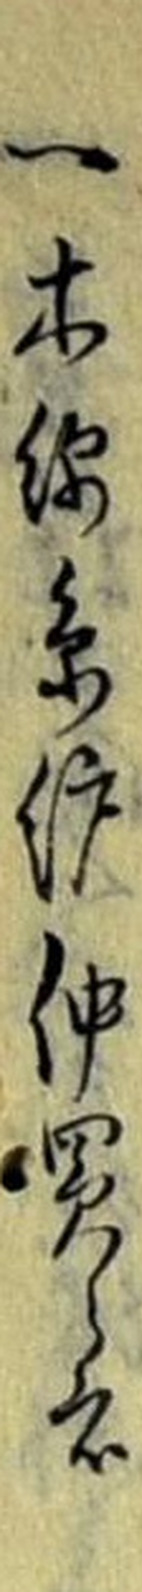一木綿糸䋆仲買之者
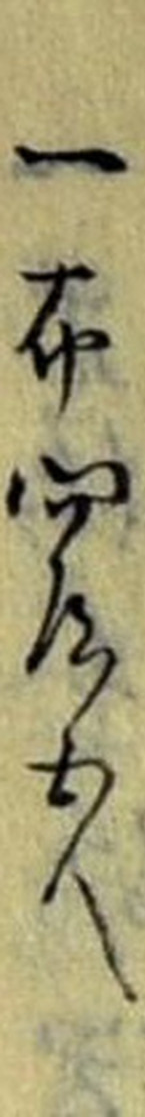一布問屋五人

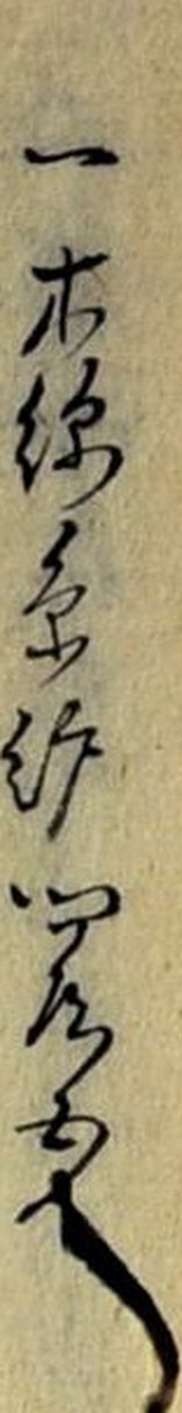一木綿糸䋆問屋五人
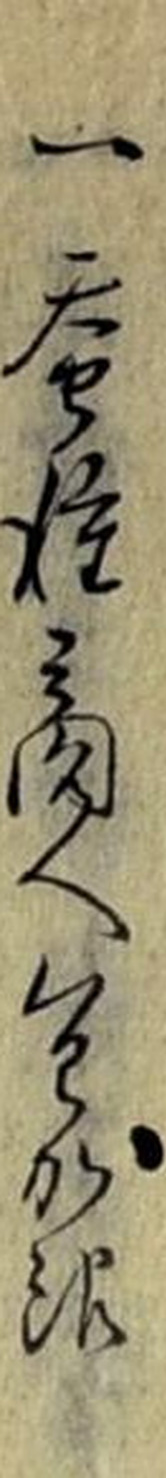一蚕種商人冥加銀
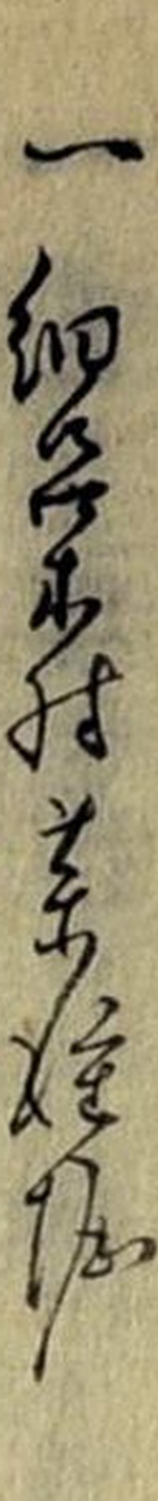一細呂木村菜種堀
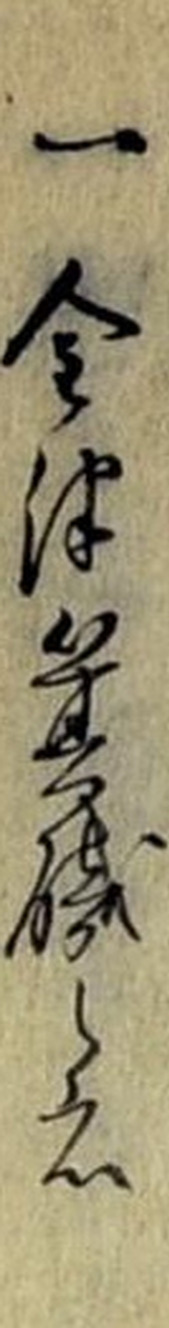一金津箕職之者
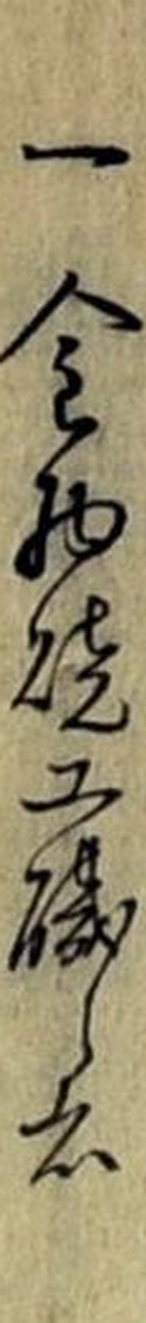一金物焼工職之者
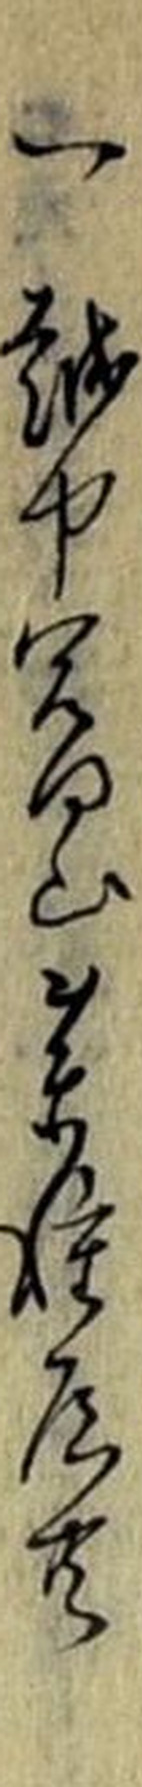一越中富山薬種屋共
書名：命令之部 五
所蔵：福井県文書館 Fukui Prefectural Archives
